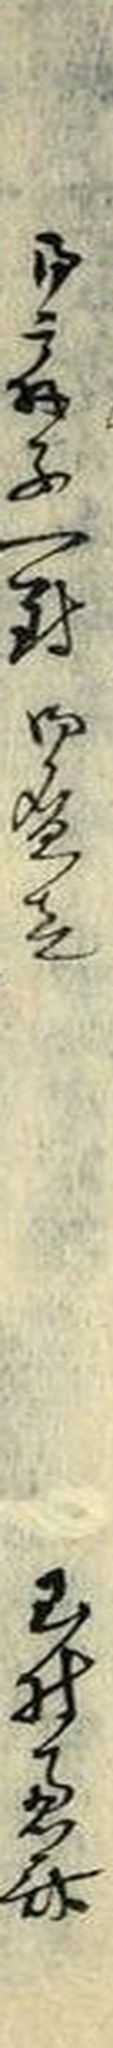御扇子一対御盃壱玉村恵斎
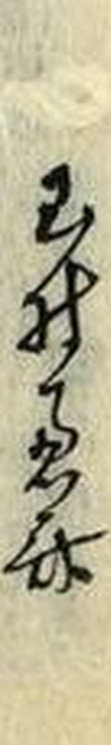玉村恵斎
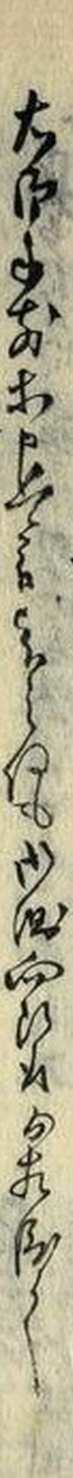右御手前等申上候ニ付被下之何も御側向頭取ゟ相渡之
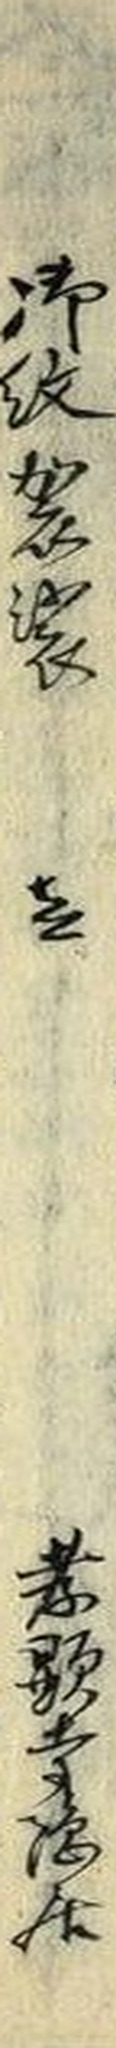御紋袈裟壱孝顕寺隠居
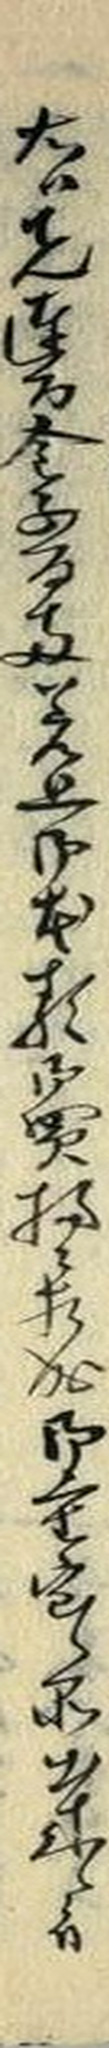右ハ先達而金子百両差上御本類御買揚ニ相成御重宝之品出来候ニ付
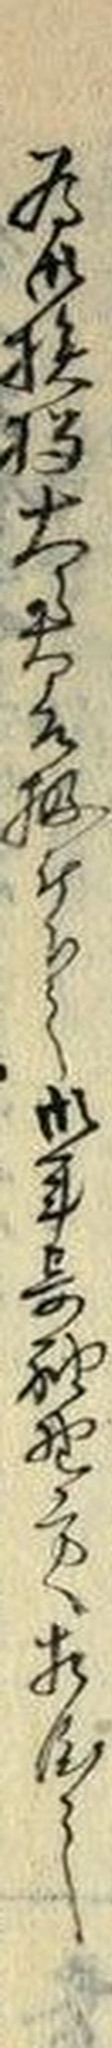為御挨拶大奥取扱被下之御年寄袖野方へ相渡之
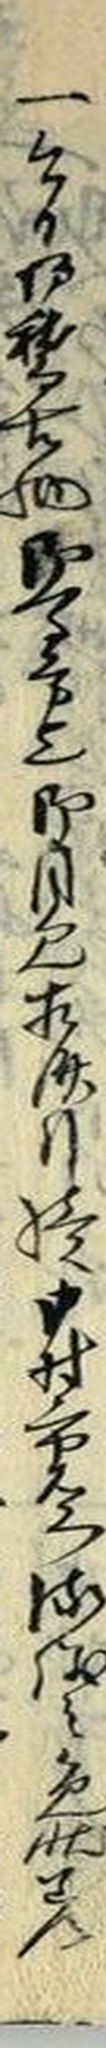一今日御稽古納御馬方迄御目見相済引続中村市右衛門流儀之免状差
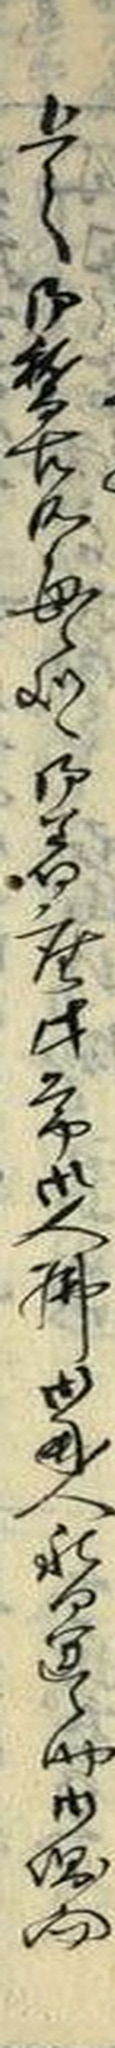上之御稽古所毎之処へ御着座此節御人払御用人秋田運之助御側向
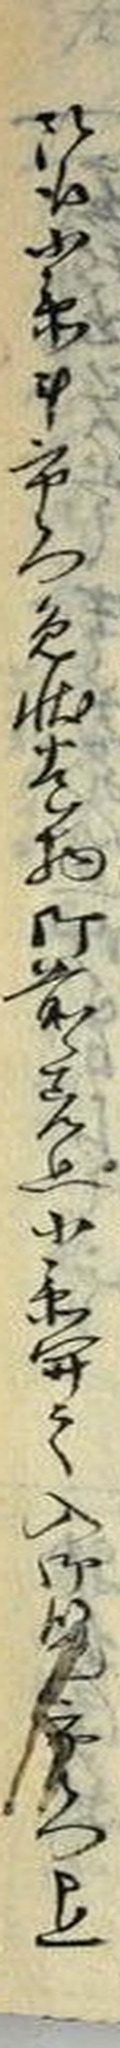頭取小兵衛斗市右衛門免状巻物御前へ差上小兵衛開之入御覧市右衛門申上
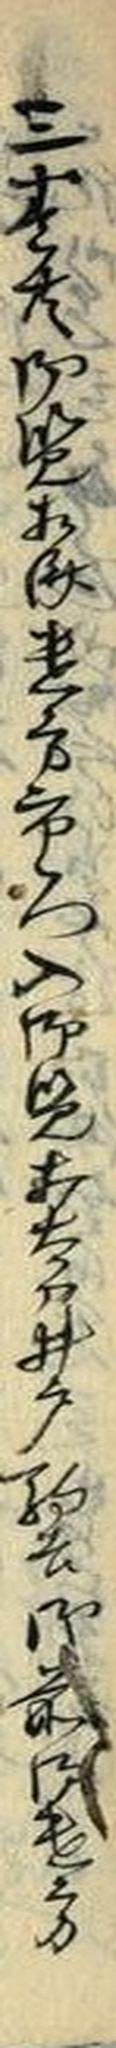三巻共御覧相済遣方市右衛門入御覧打太刀井戸駒吉御前御遣方
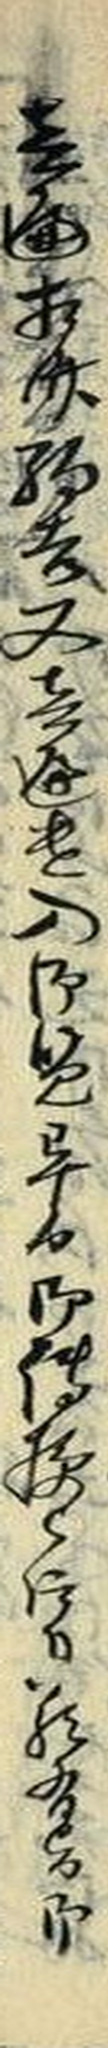壱通相済駒吉又壱通遣入御覧畢而御伝授被仰付難有旨御
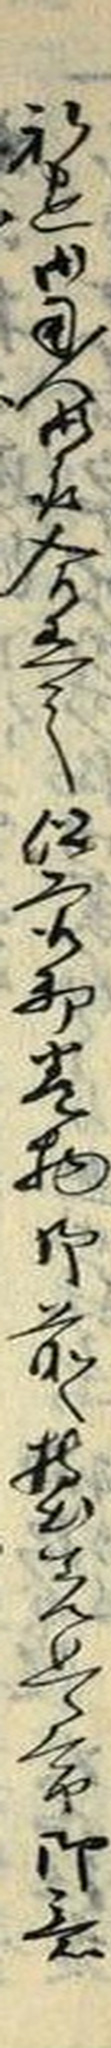礼申上御用人御取合有之但最初巻物御前へ持出差上候節御意
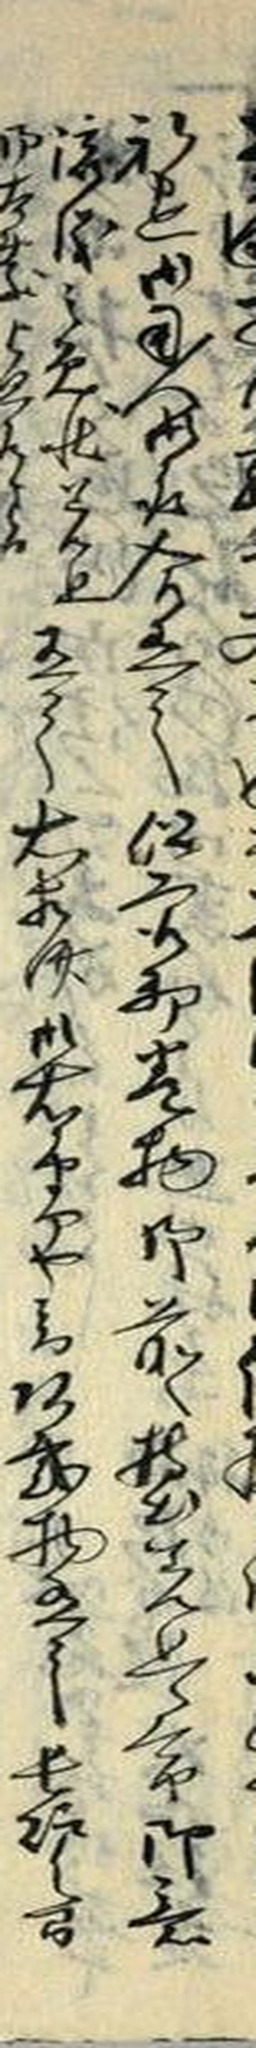御大慶被思召候旨有之右相済御右筆部やニ而頂戴物有之長炉之間
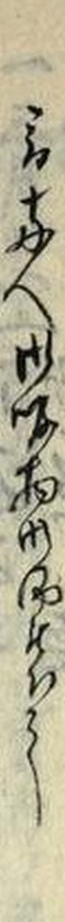ニ而両人御吸物御酒被下之
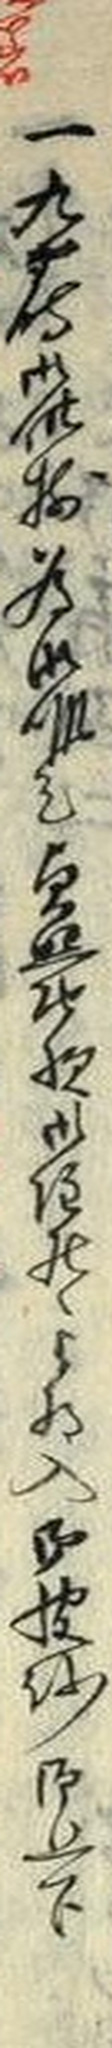一九半時御供揃為御暇乞貞照院様御住居へ被為入御服紗御上下
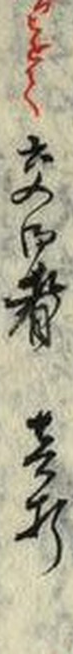交御肴壱折
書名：少傅日録抄（斉承付側向頭取日記、在国）
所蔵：福井県文書館 Fukui Prefectural Archives
